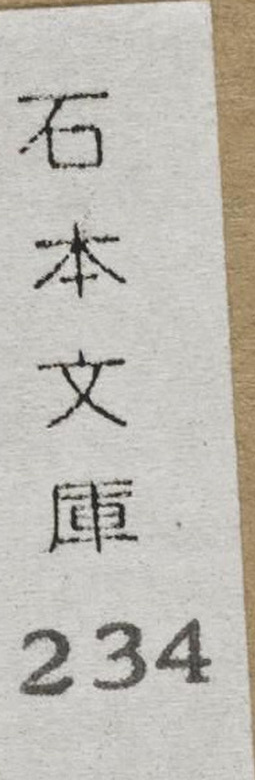石本文庫

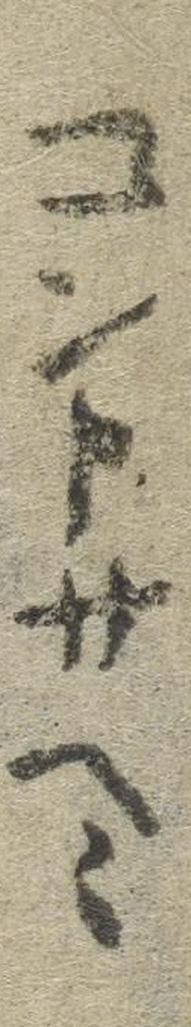コントサヘゝ
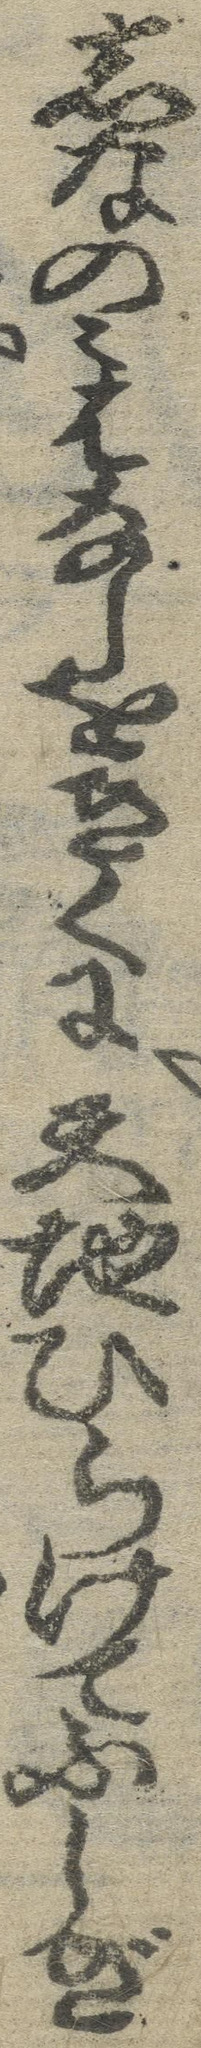しなのゝはなしをきくに。天地ひらけてふしぎ
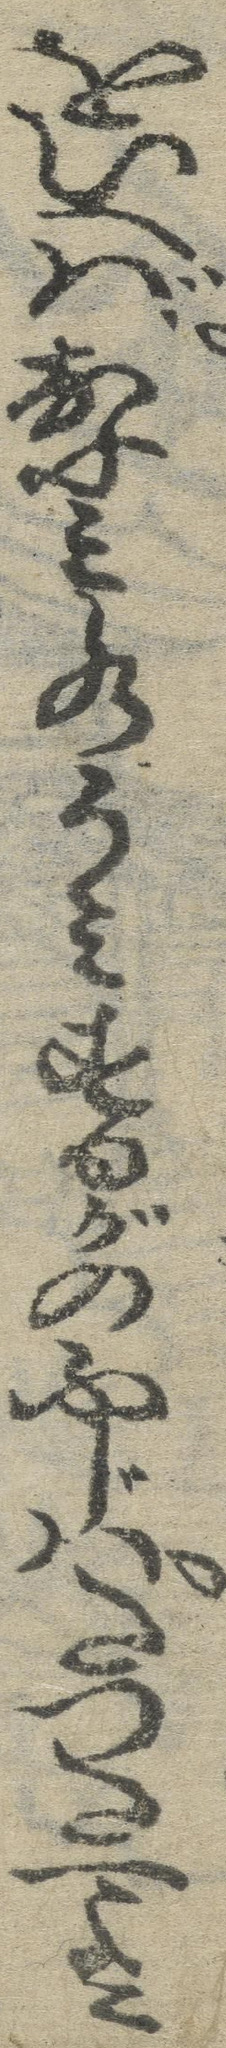をいへば。あふみのうみするがのふじは。たつた一よに
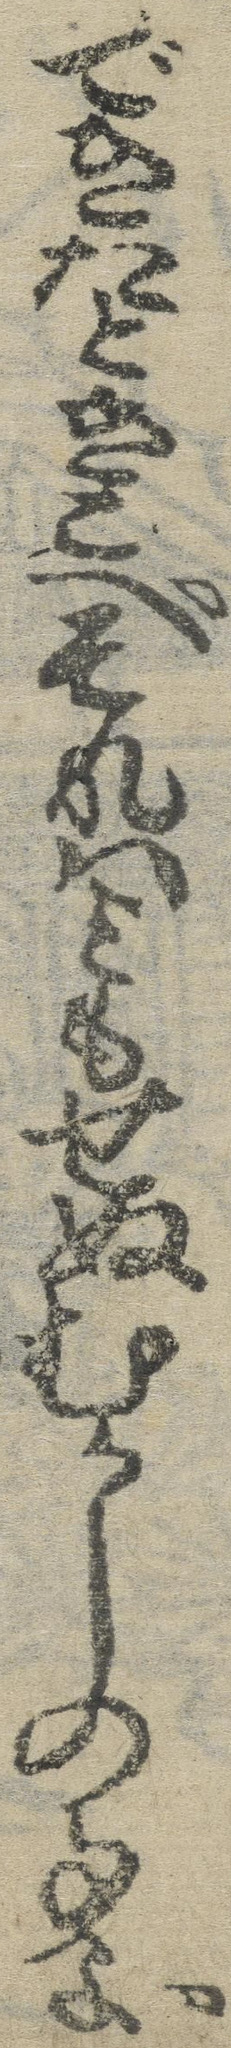できたときこへ。それはみもせぬむかしの事よ。
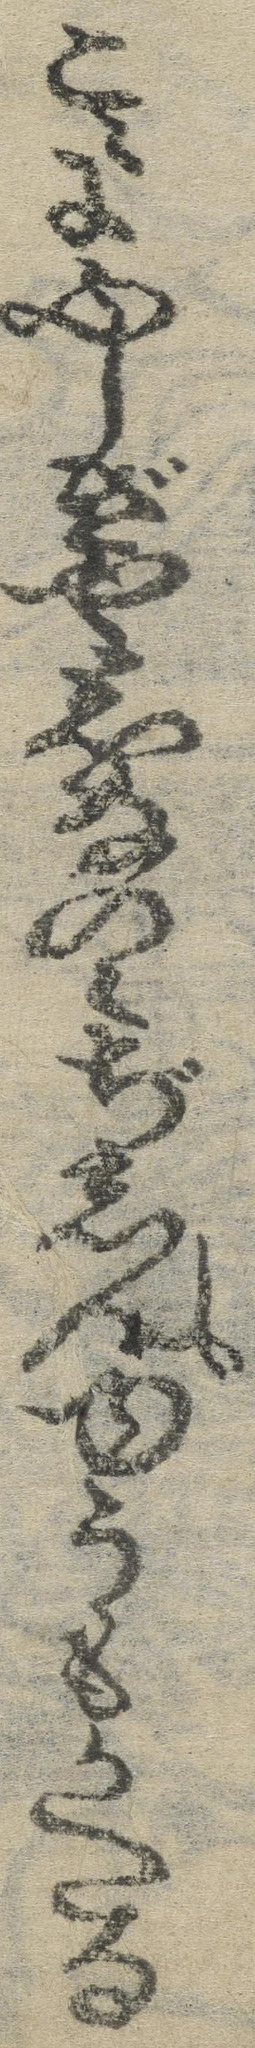こゝにふしぎやしなのゝぢしん。ゆうもかたる
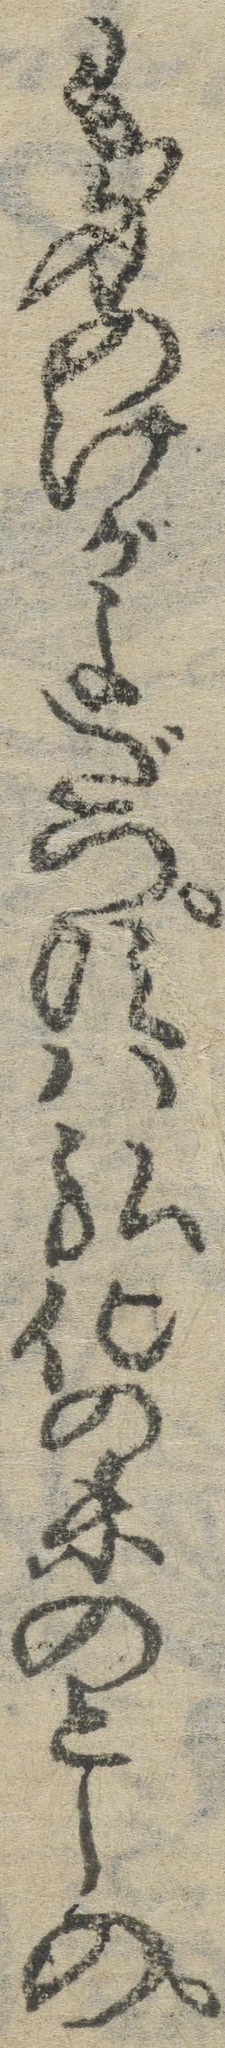もみのけがよだつ。頃は弘化の末のとしの。
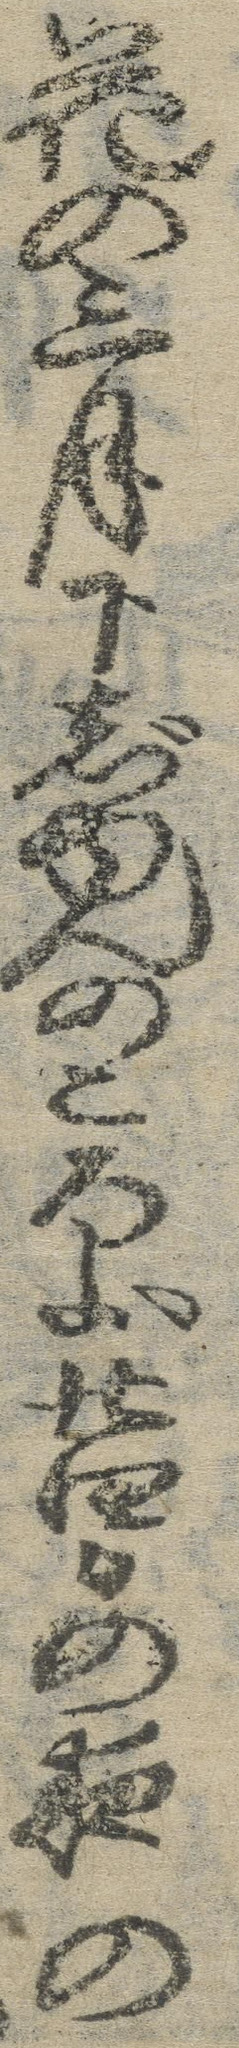花の三月下ぢゆんのころよ。廿四日の夜の
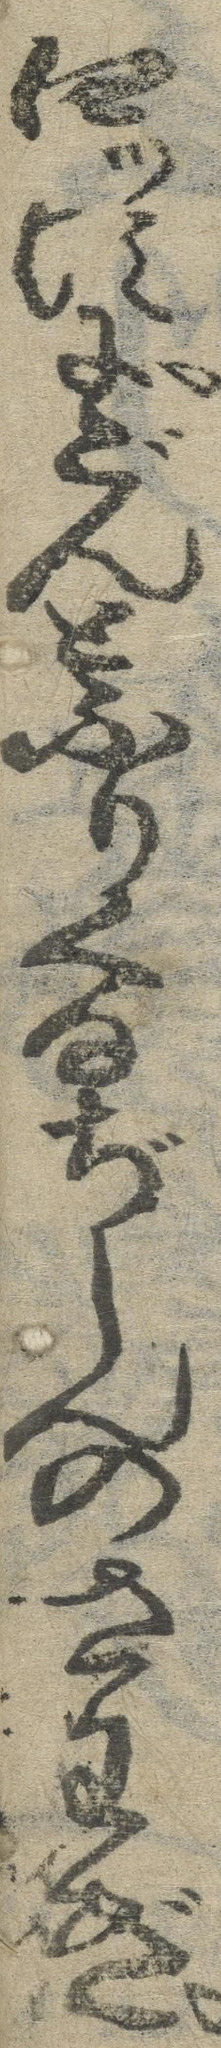四ツ頃に。どんとふりくるぢじんのさわぎ。
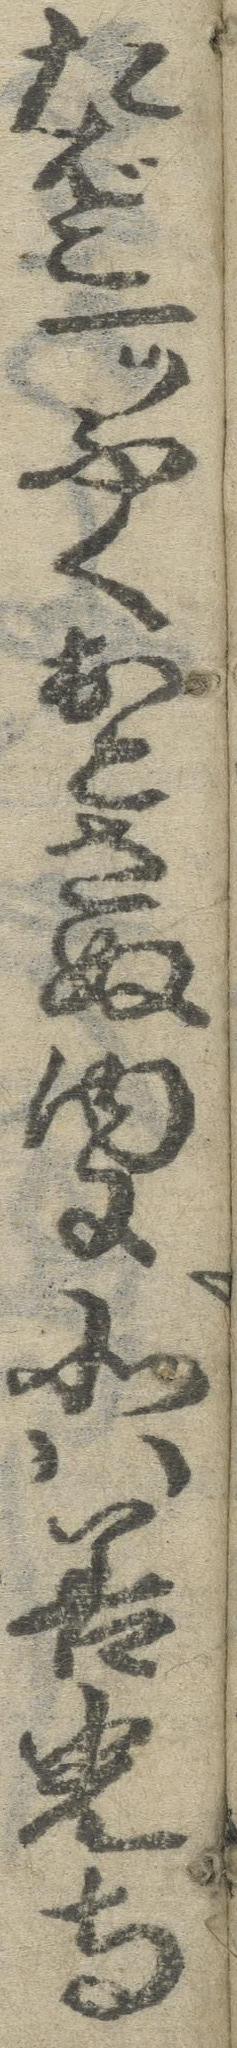たばこ一ツふくおとさぬ内に。所は善光寺
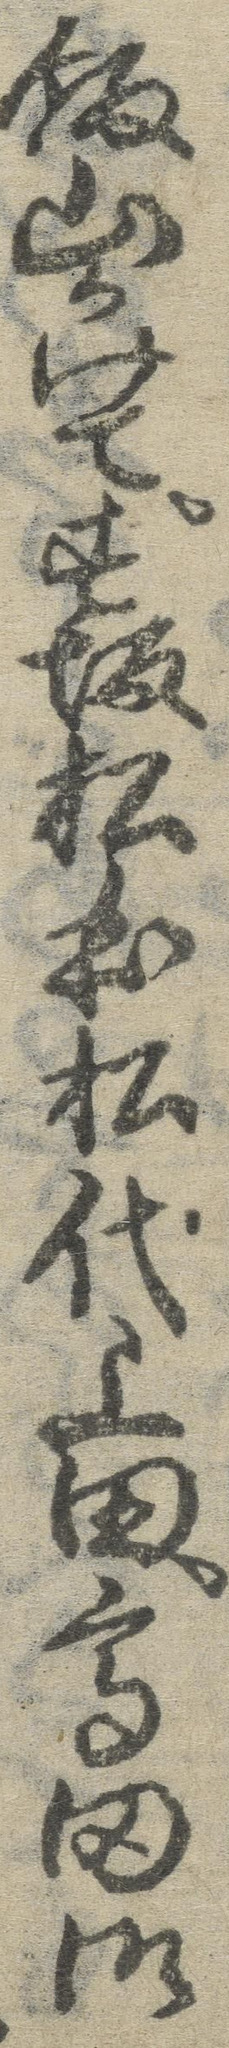飯山かけて。春坂松本松代上田。富田御
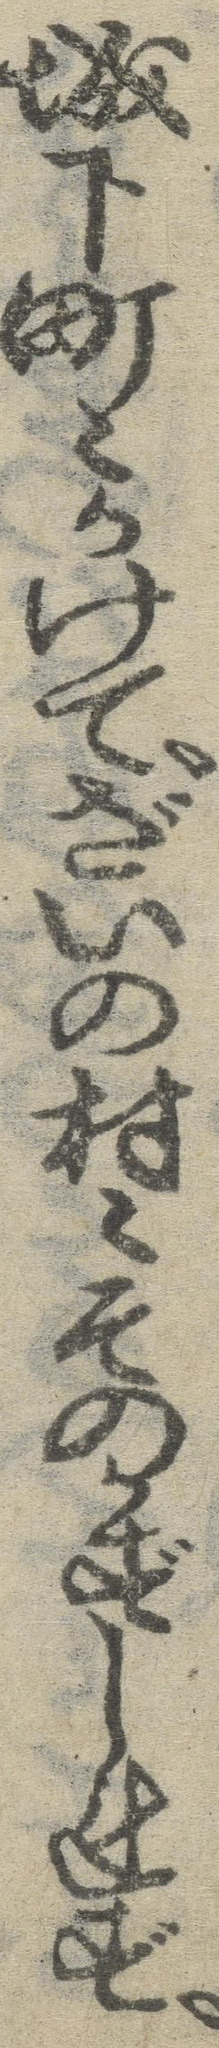城下町にゝけて。ざいの村そのかずしれず。
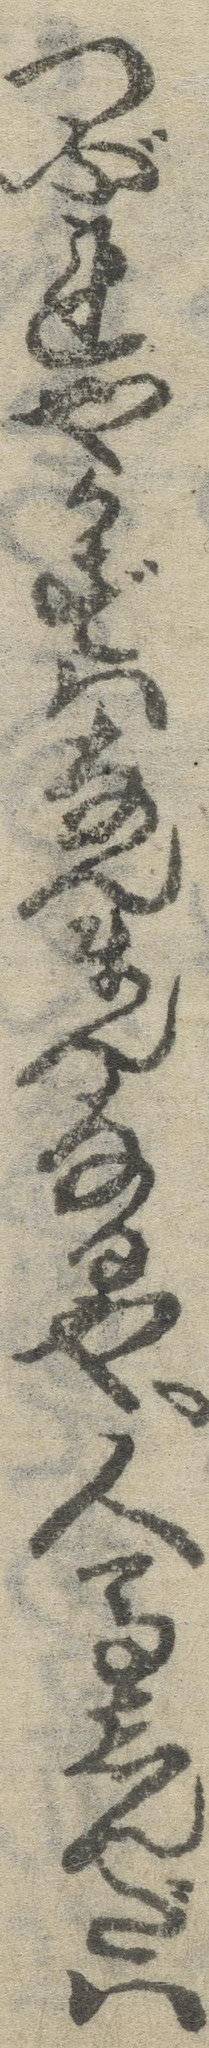つぶれやがずはなんまんなるや。人馬しんだは
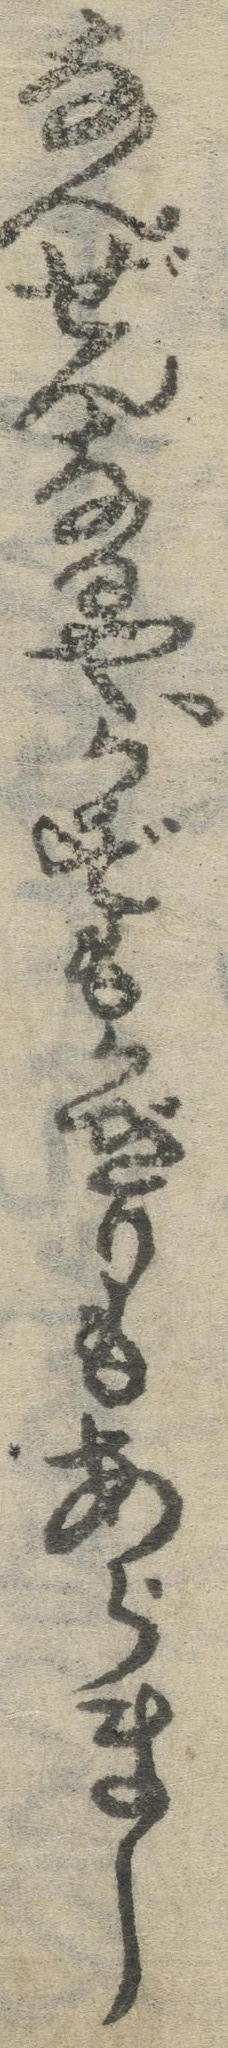なんぜんなるや。かずもかぎりもあらまし
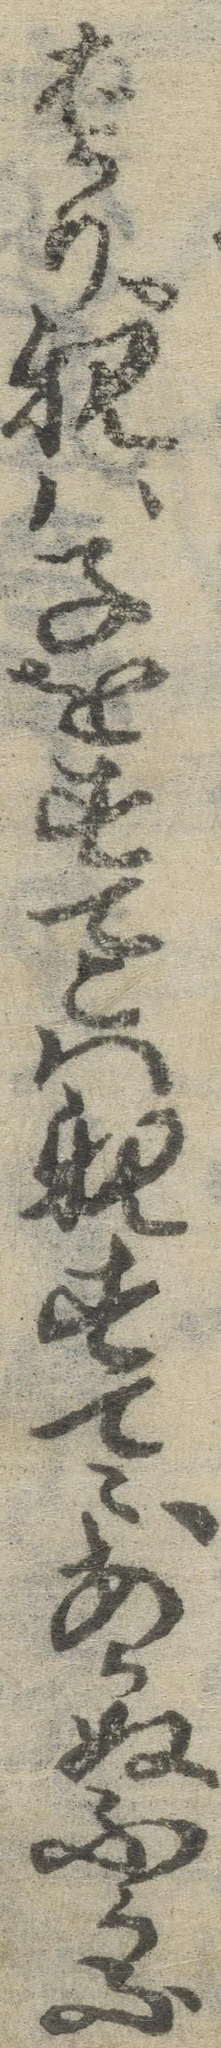ばかり。親は子をすてこへは親すてゝ、あかぬふうふ
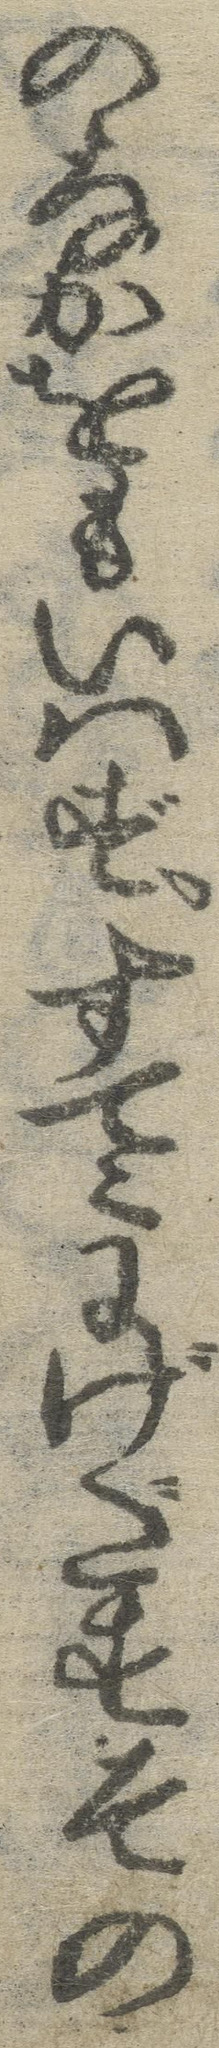のなかをもいはず。すてゝにげだすその
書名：信州ぢしんやんれぶし　上・下
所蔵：東京大学地震研究所図書室 Earthquake Research Institute Library, The University of Tokyo, JAPAN
